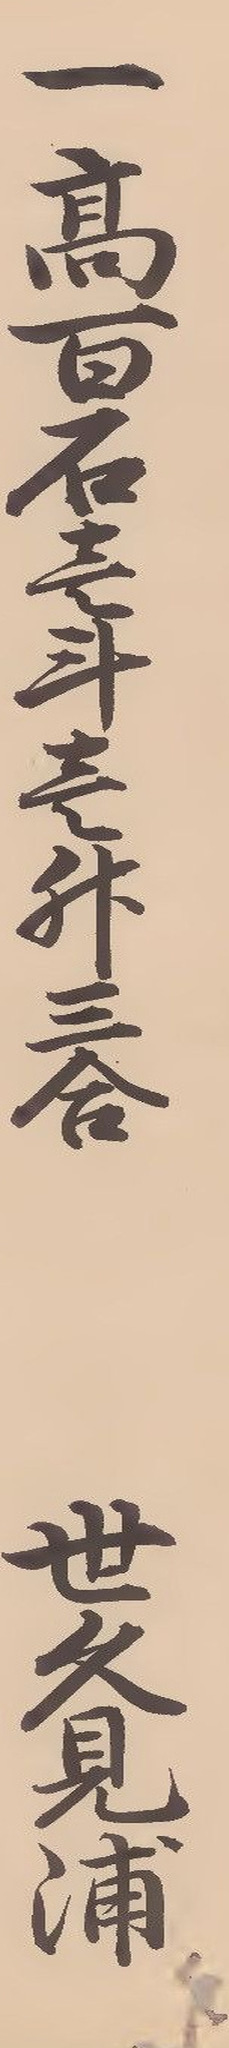一高百石壱斗壱升三合世久見浦
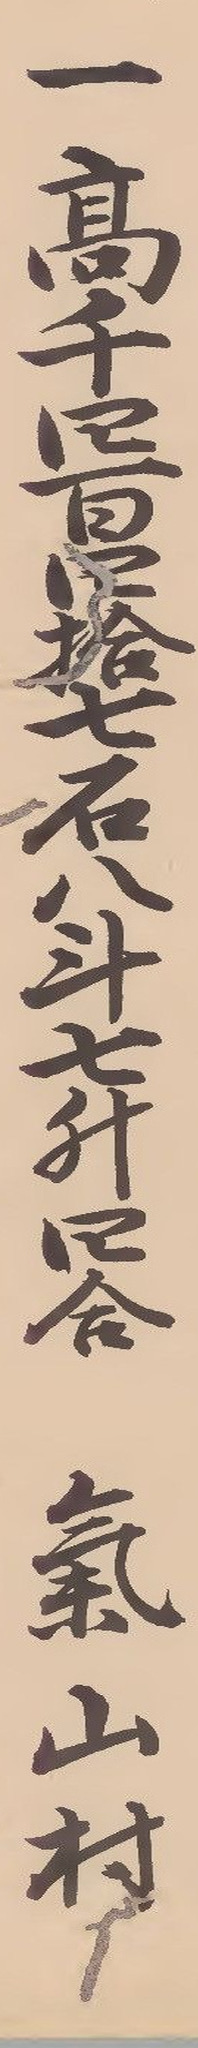一高千四百四拾七石八斗七升四合気山村

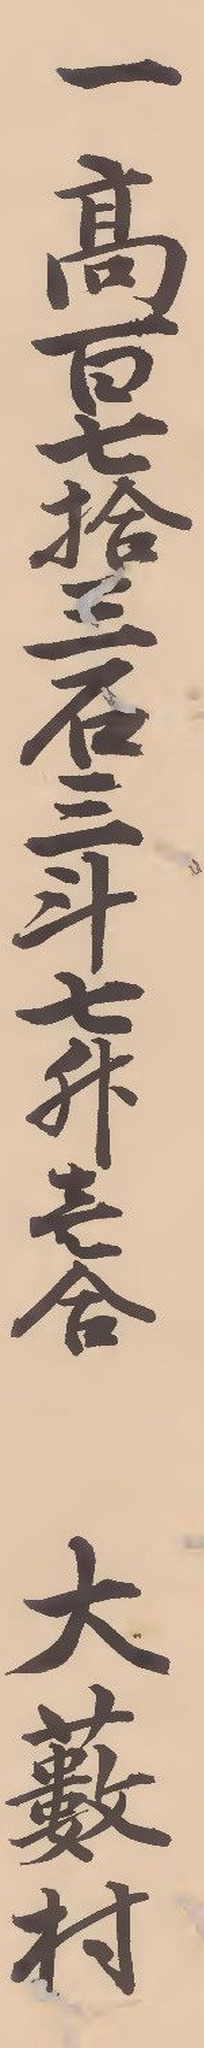一高百七拾三石三斗七升壱合大藪村
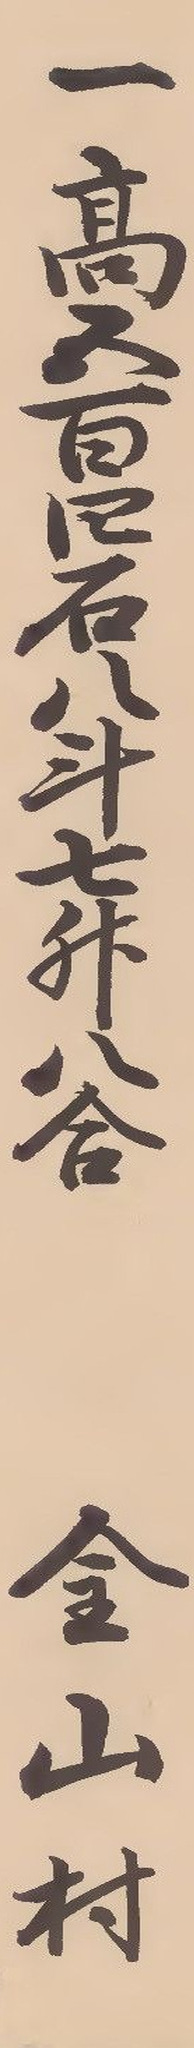一高五百四石八斗七升八合金山村
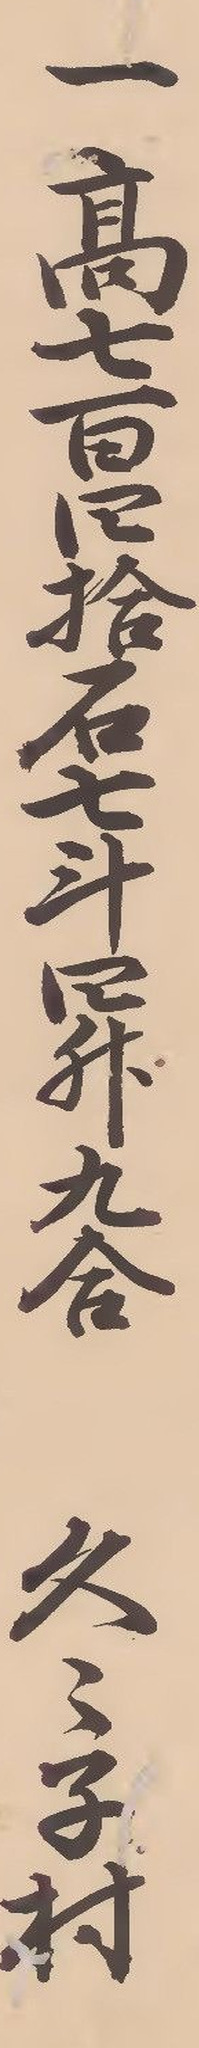一高七百四拾石七斗四升九合久々子村
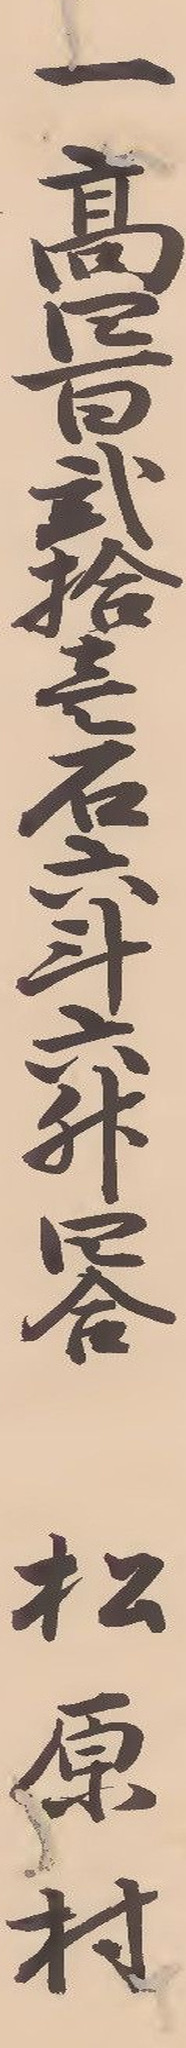一高四百弐拾壱石六斗六升四合松原村
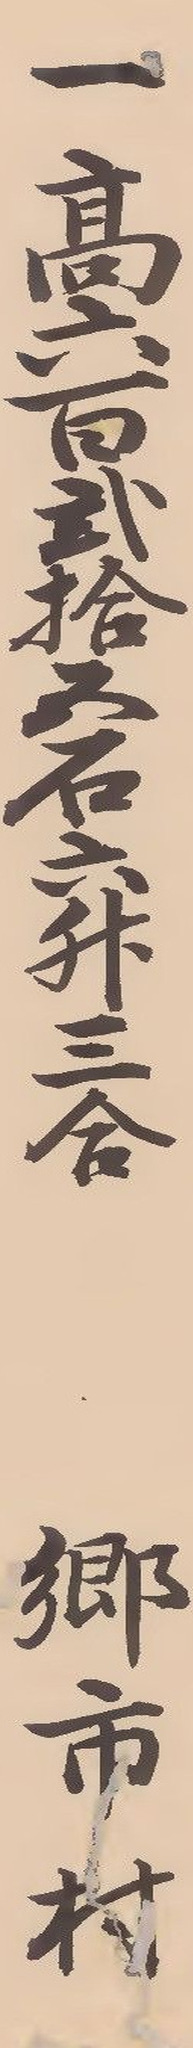一高六百弐拾五石六升三合郷市村
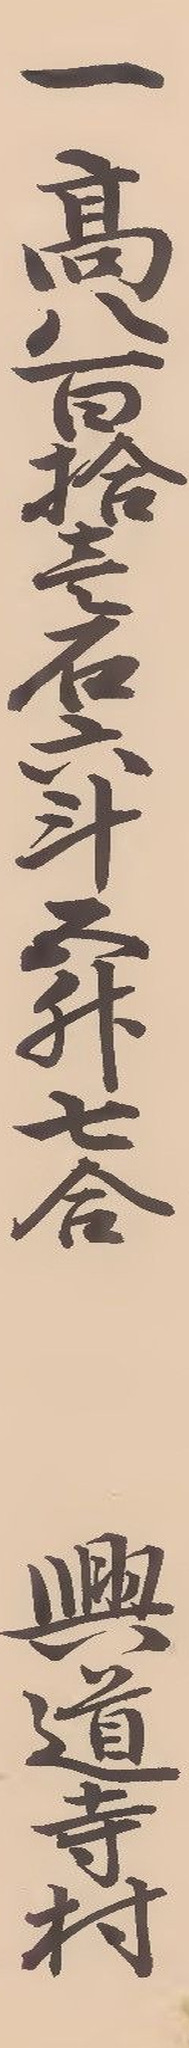一高八百拾壱石六斗五升七合興道寺村
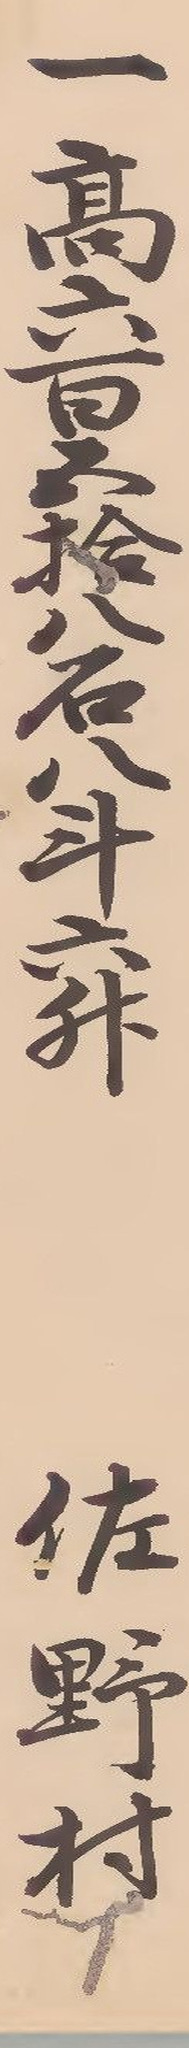一高六百五拾八石八斗六升佐野村

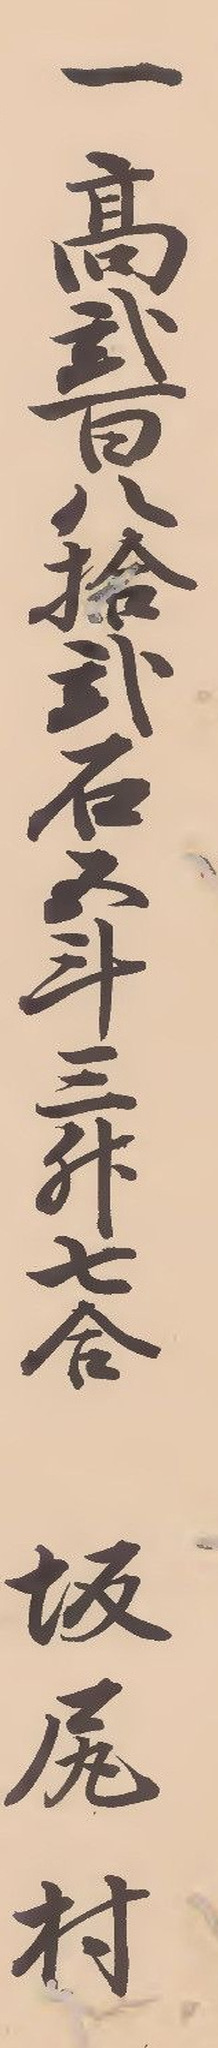一高弐百八拾弐石五斗三升七合坂尻村
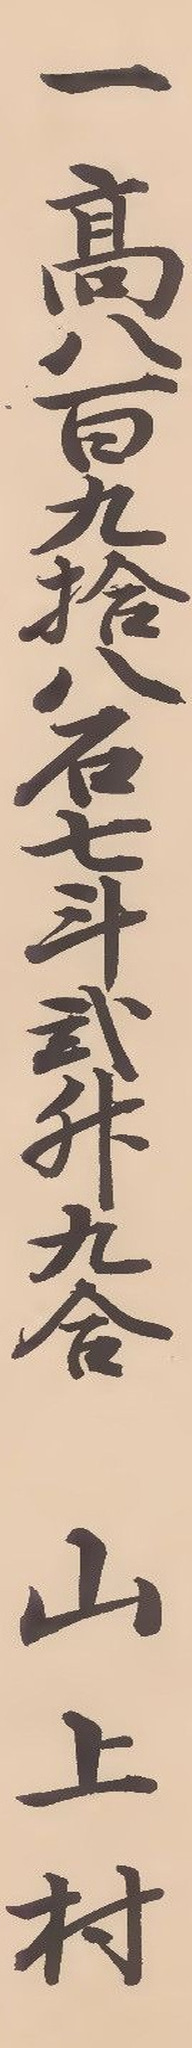一高八百九拾八石七斗弐升九合山上村
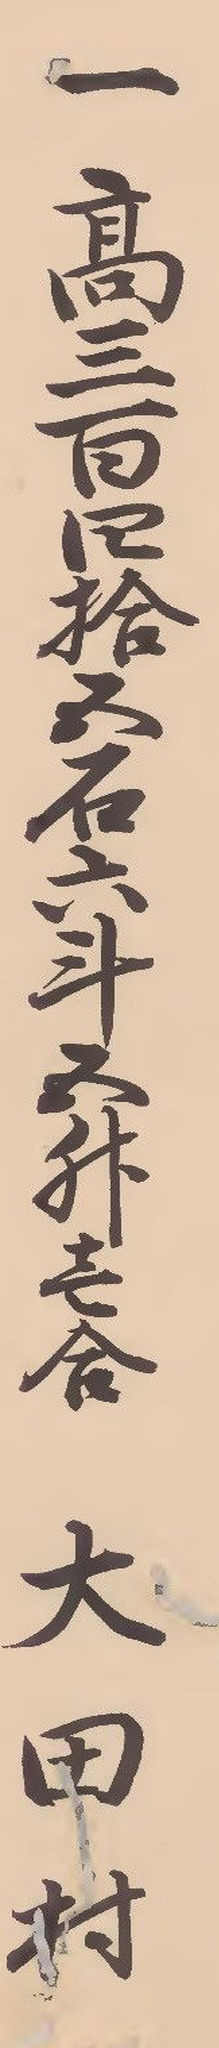一高三百四拾五石六斗五升壱合大田村
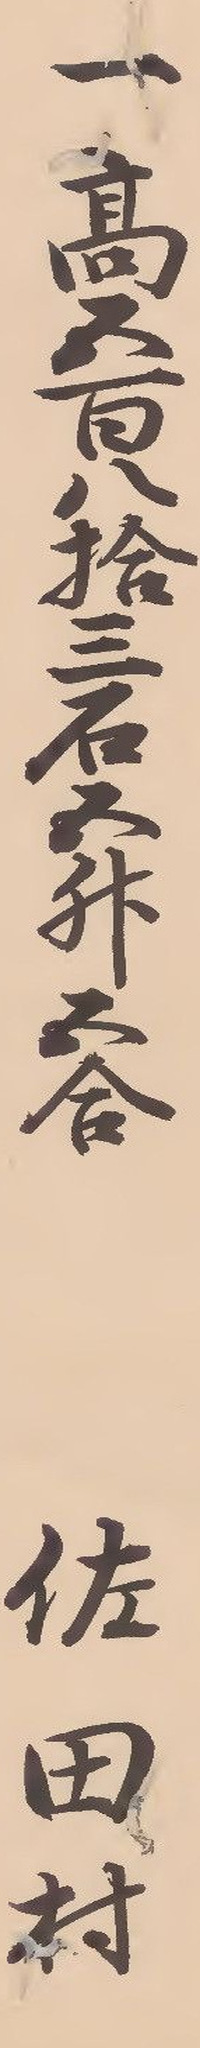一高五百八拾三石五升五合佐田村
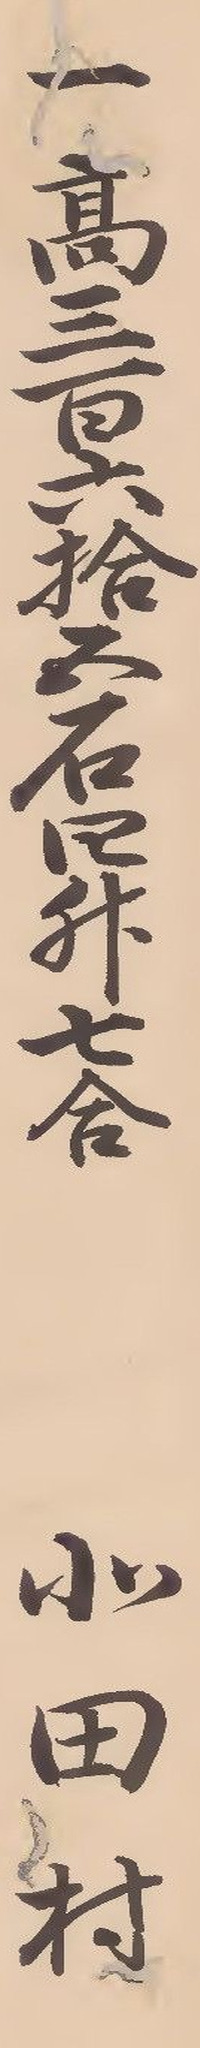一高三百六拾五石四升七合北田村
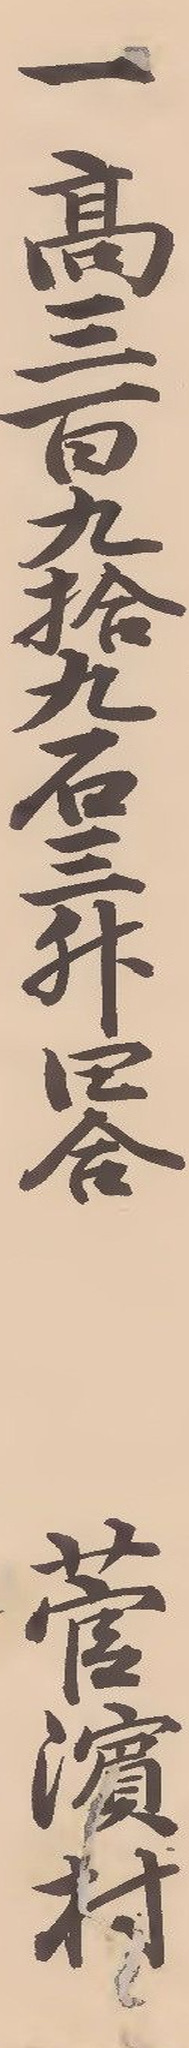一高三百九拾九石三升四合菅浜村
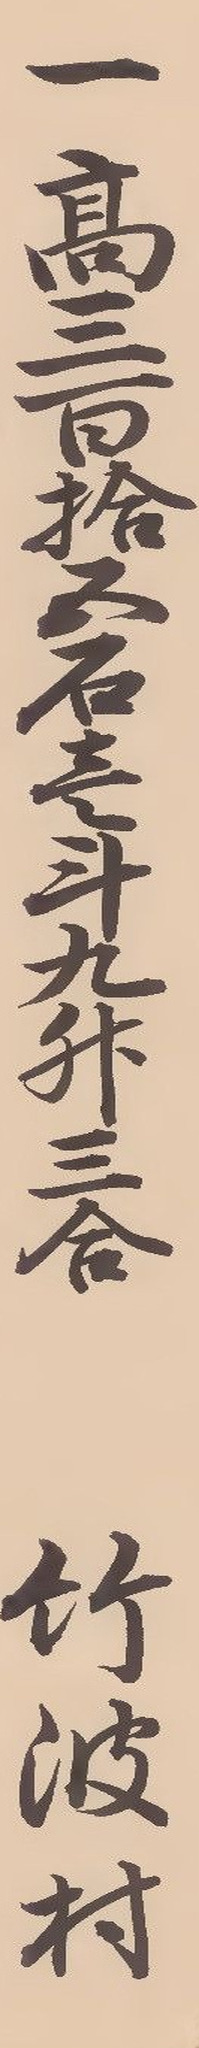一高三百拾五石壱斗九升三合竹波村
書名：若狭国郷帳
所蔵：国立公文書館 National Archives of Japan
